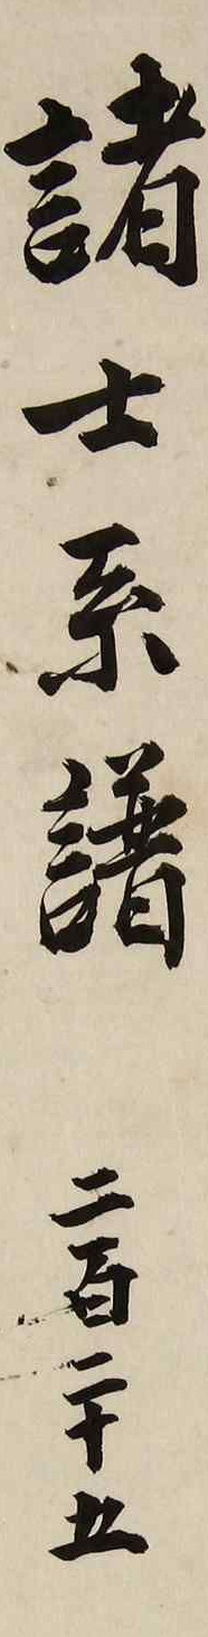諸士系譜二百二十五

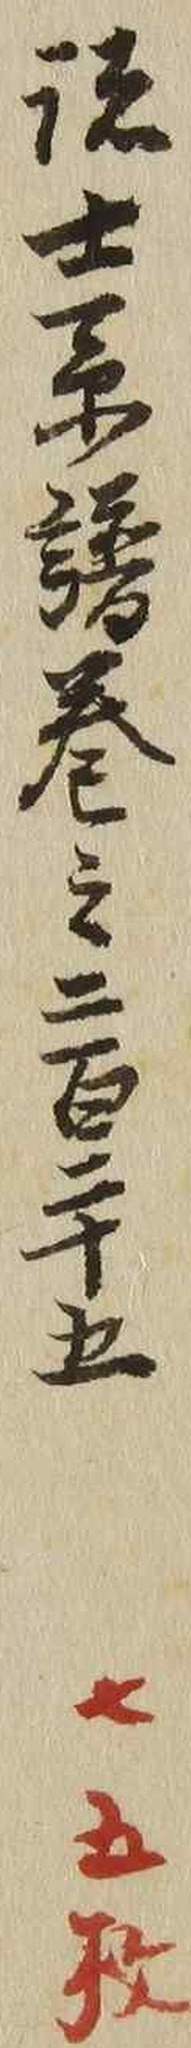諸士系譜巻之二百二十五七五枚
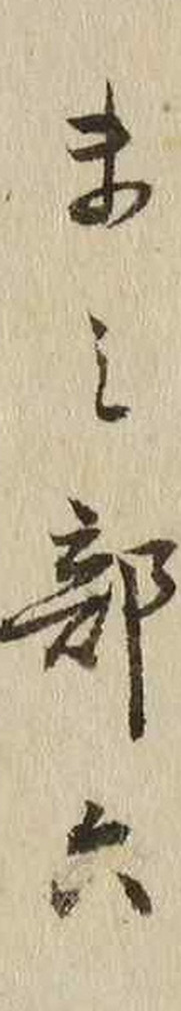ま之部六
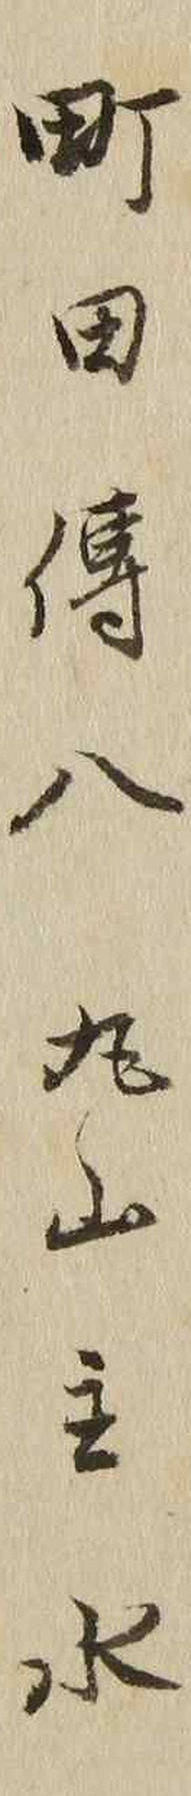町田伝八丸山主水

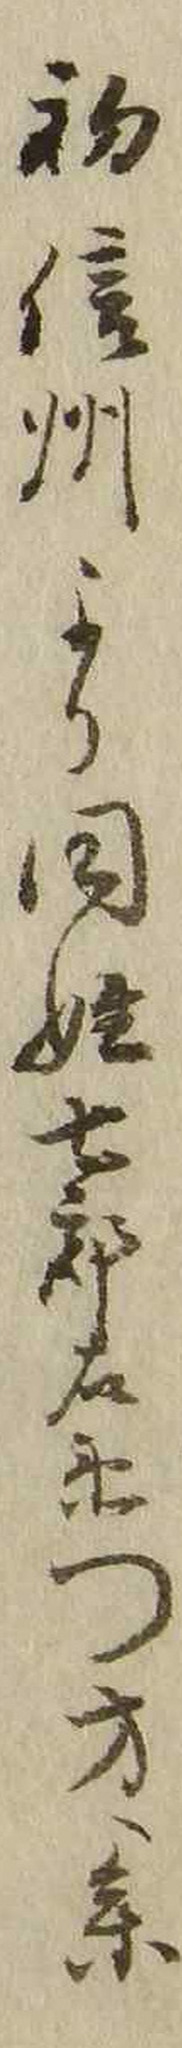初信州より同姓七郎左衛門方へ参
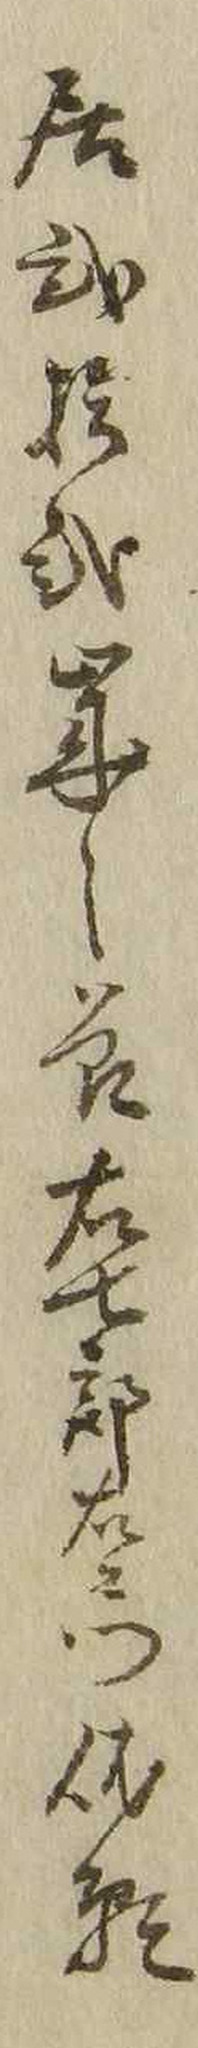居弐拾弐歳之節右七郎右衛門依願
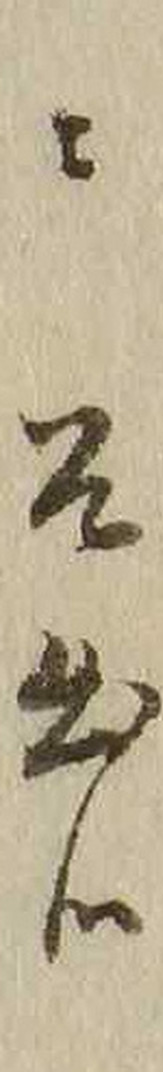被召出候
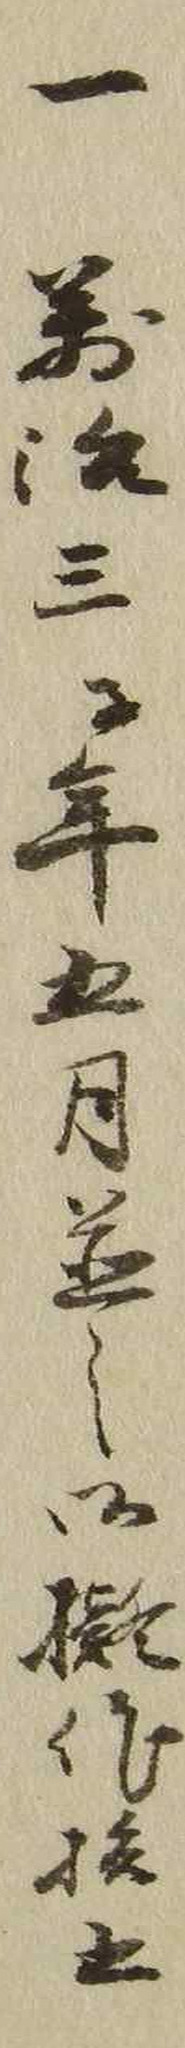一万治三子年五月並之御擬作拾五
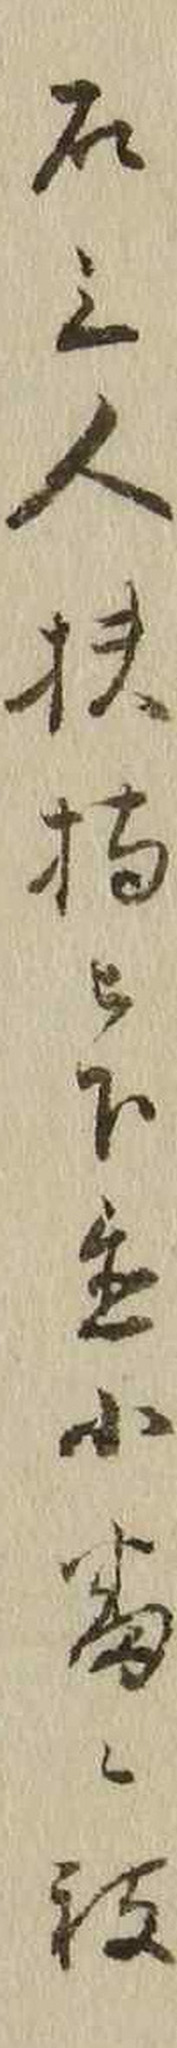石三人扶持被下置小番ニ被
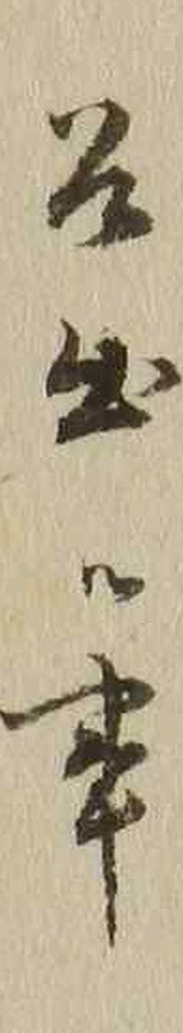召出候事
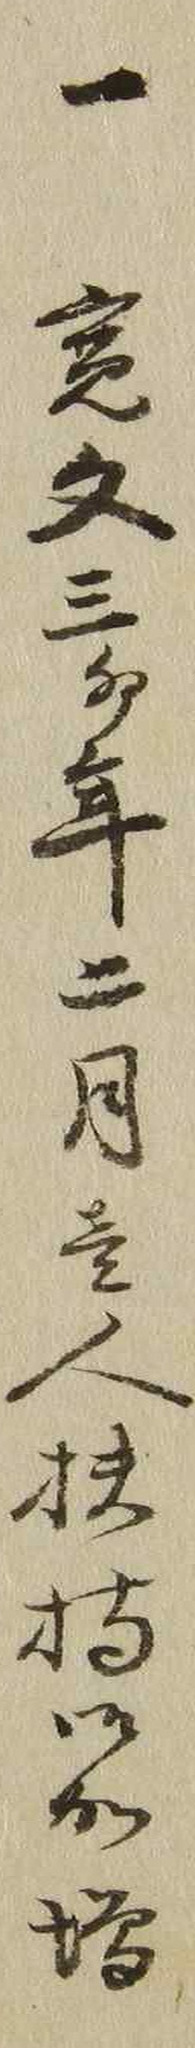一寛文三卯年二月壱人扶持御加増
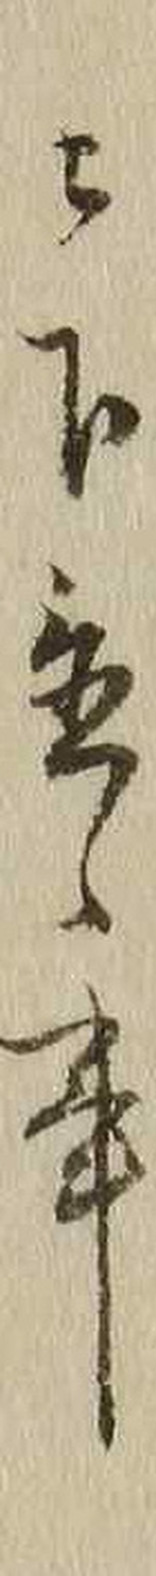被下置候事
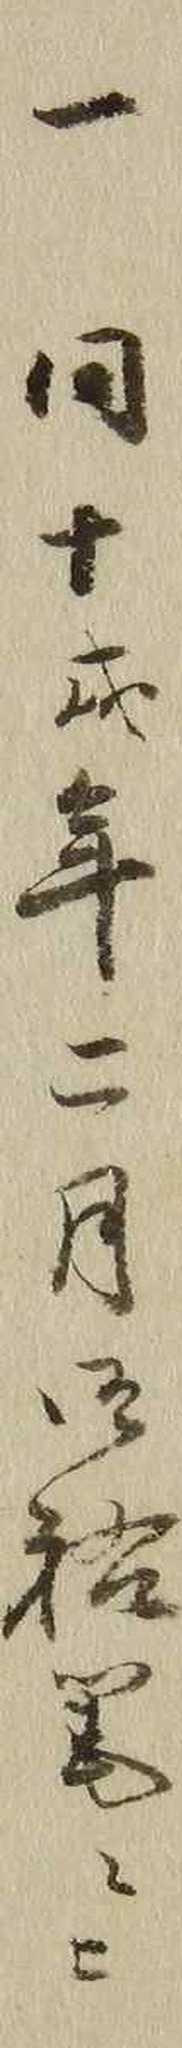一同十戌年二月御祐筆ニ被
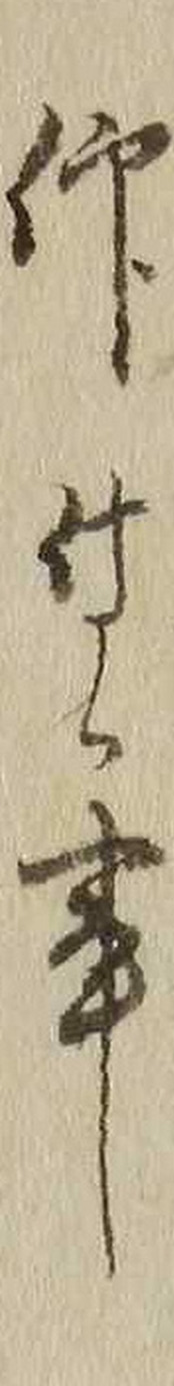仰付候事
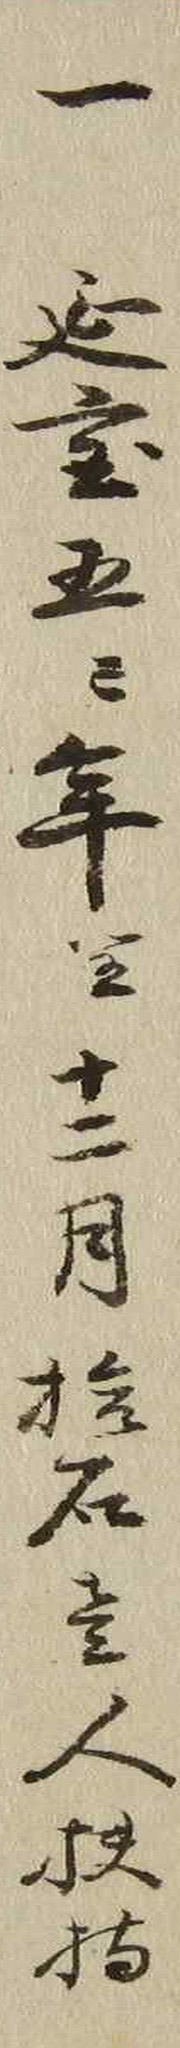一延宝五巳年閏十二月拾石壱人扶持
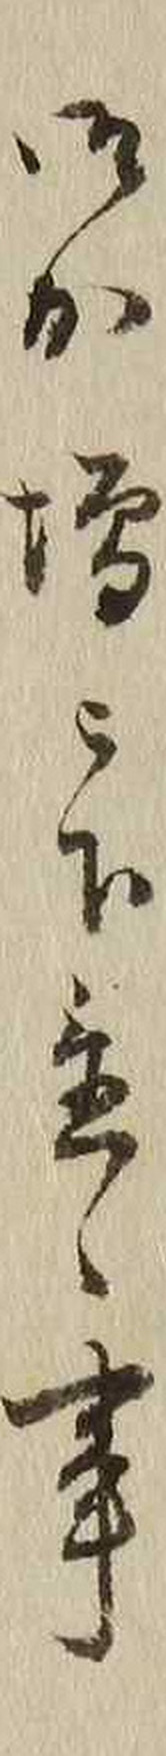御加増被下置候事
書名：諸士系譜　巻之225　ま之部6
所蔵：会津若松市立会津図書館
